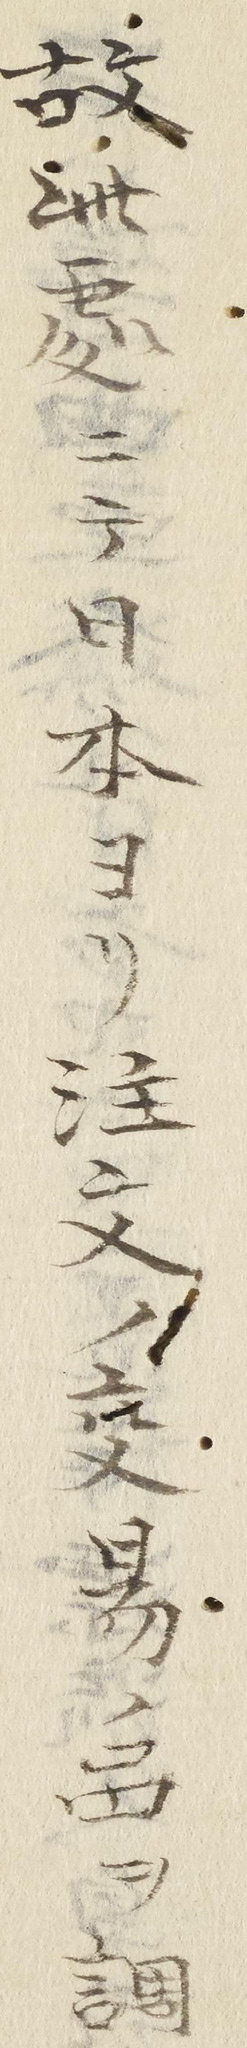故此処ニテ日本ヨリ注文ノ交易ノ品ヲ調
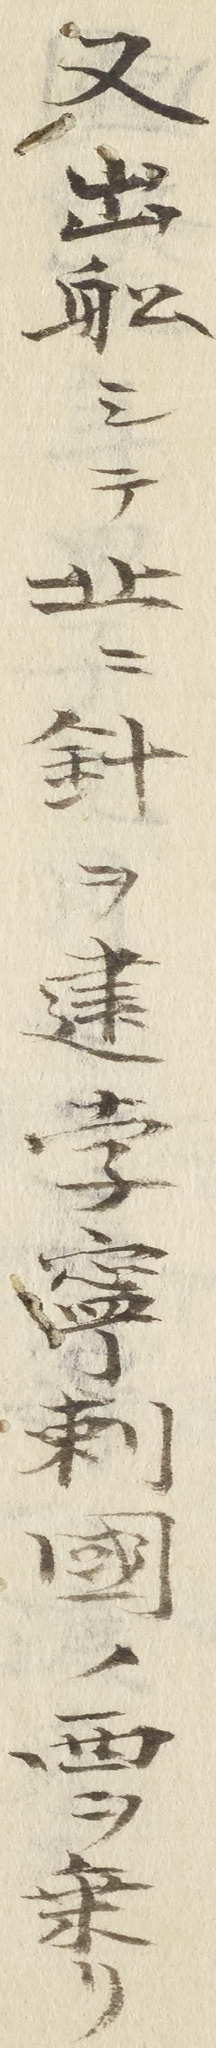又出船シテ北ニ針ヲ建孛寧刺国ノ西ヲ乗リ
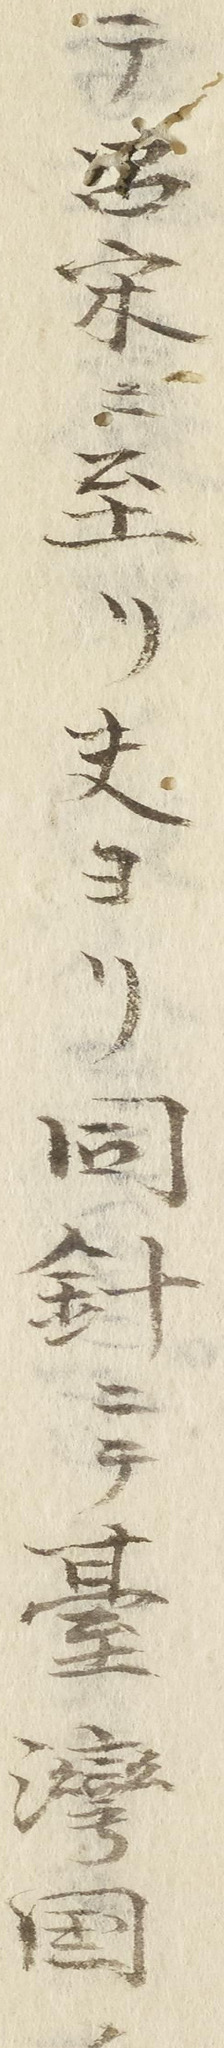テ呂宋ニ至リ夫ヨリ同針ニテ台湾国ノ
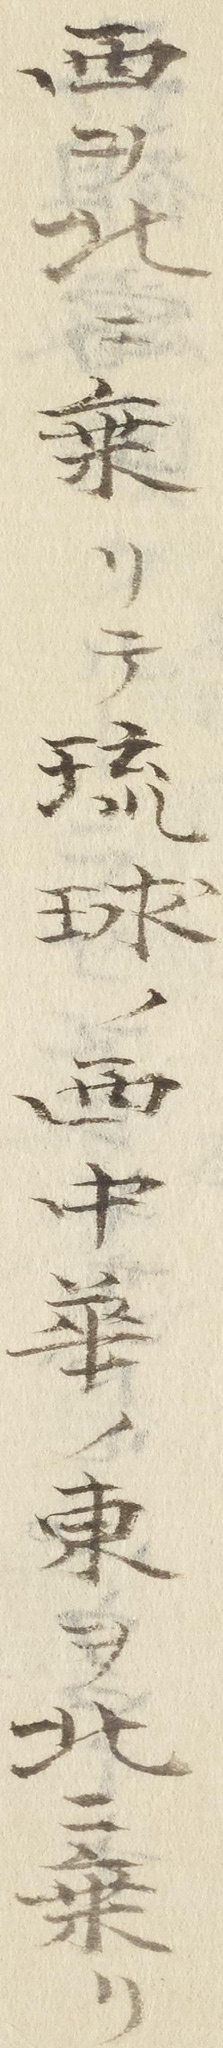西ヲ北ニ乗リテ琉球ノ西中華ノ東ヲ北ニ乗リ
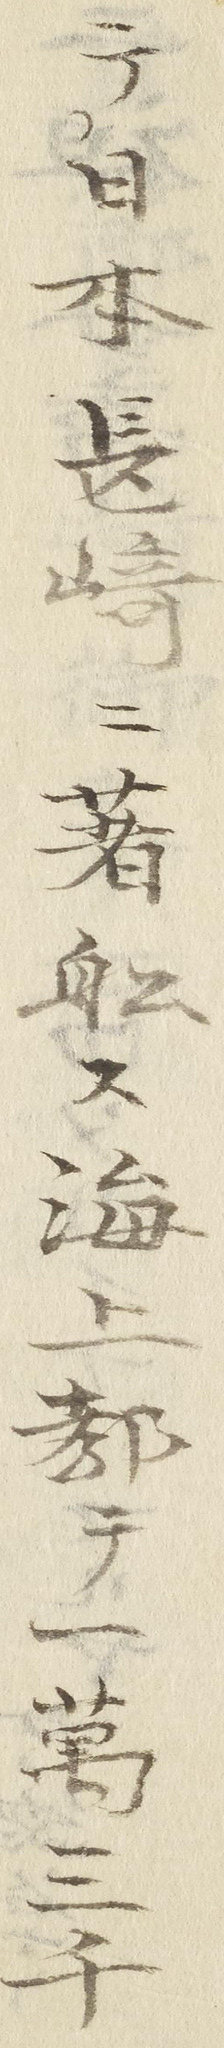ニテ日本長崎ニ着船ス海上都テ一万三千
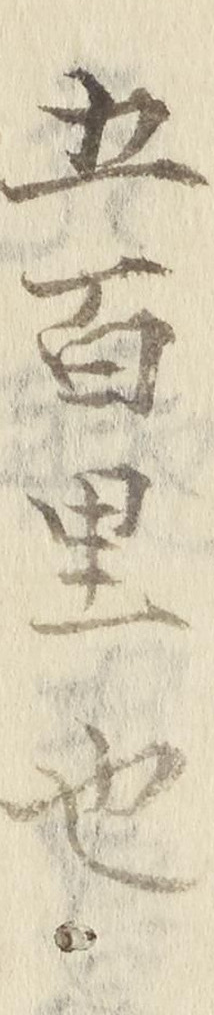五百里也
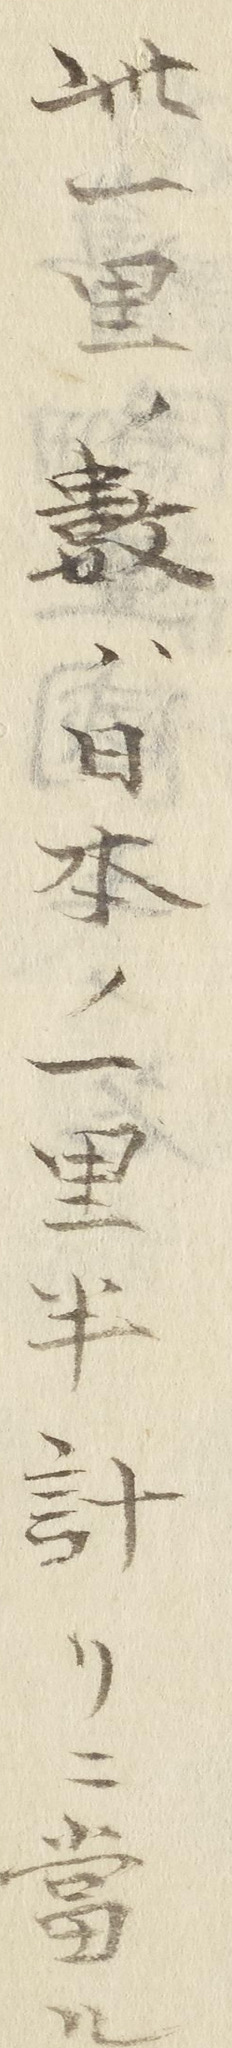此一里ノ数ハ日本ノ一里半計リニ当ル

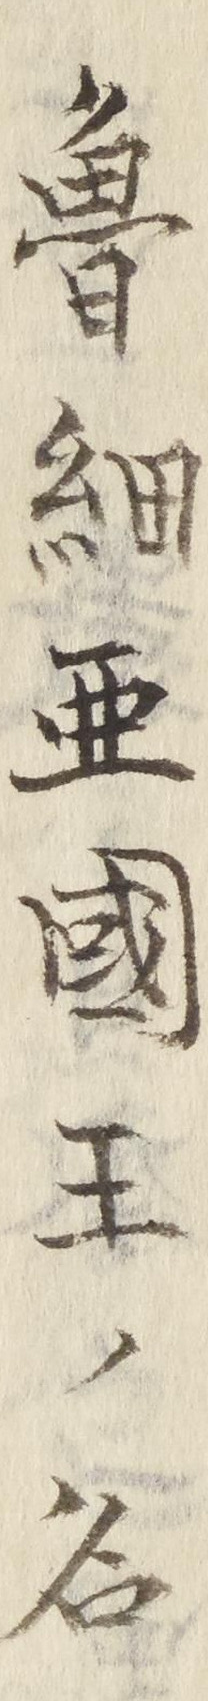魯細亜国王ノ名
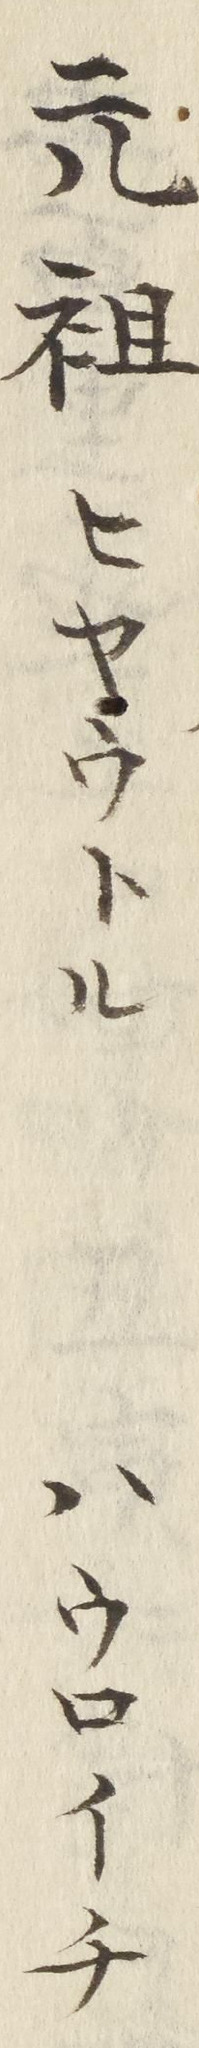元祖ヒヤウトルハウロイチ
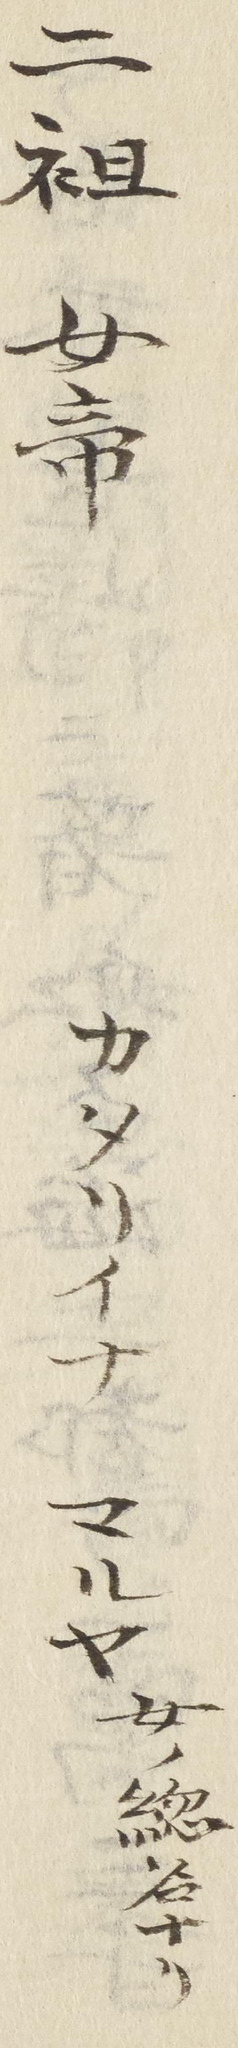二祖女帝カタリイナマルヤ女ノ総名
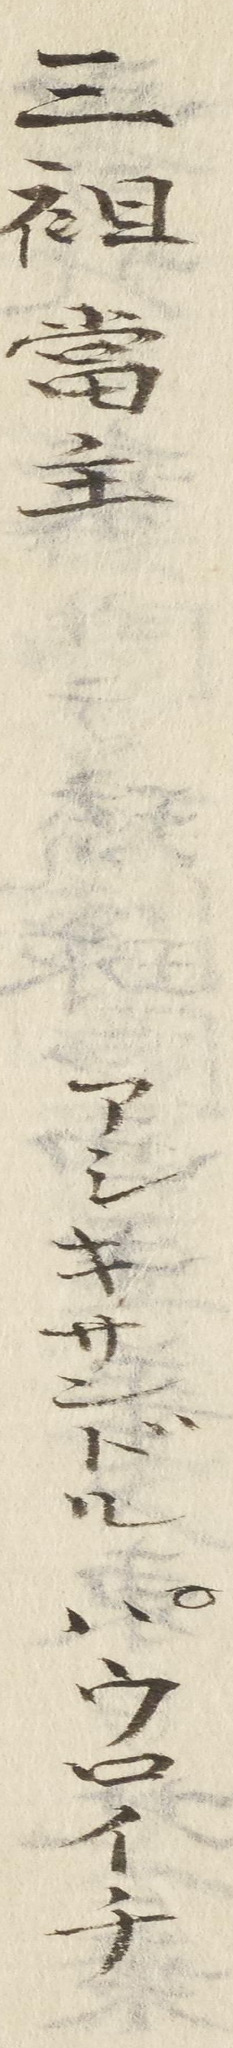三祖当主アシキサンドルパウロイチ
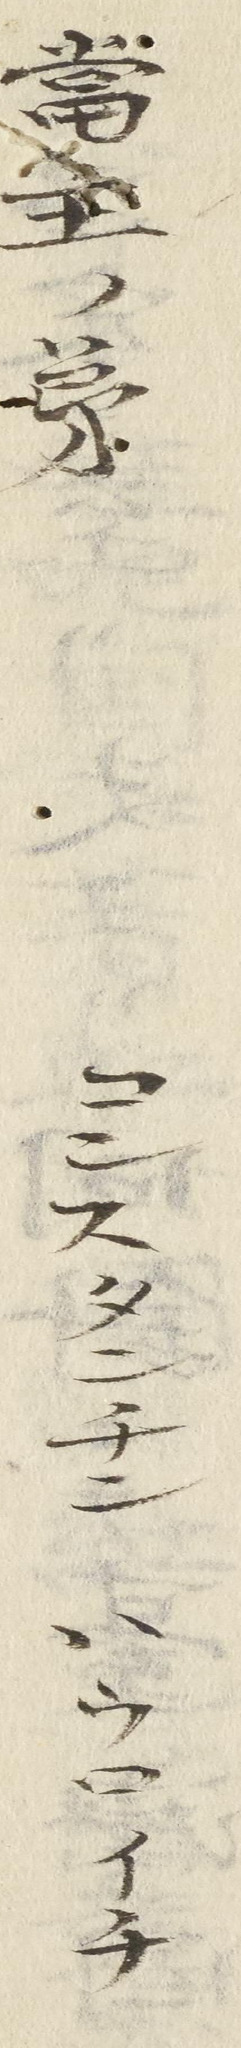当主ノ弟コンスタンチンハウロイチ
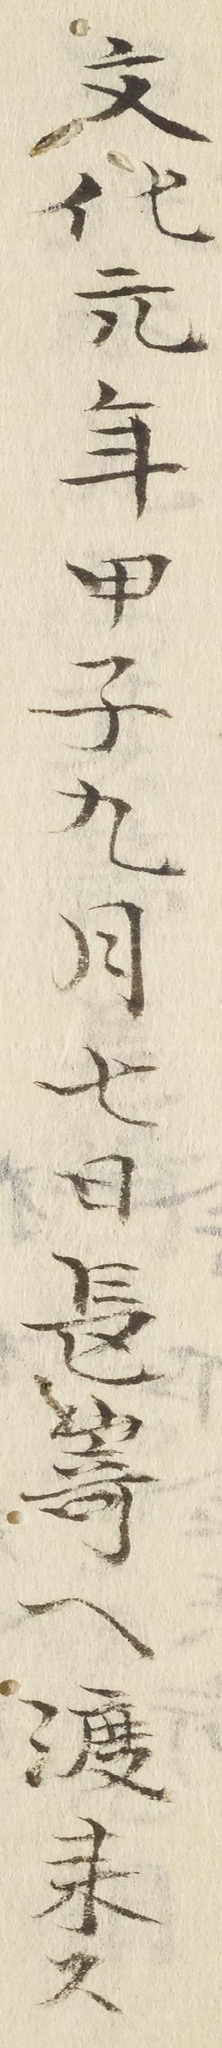文化元年甲子九月七日長崎ヘ渡来ス
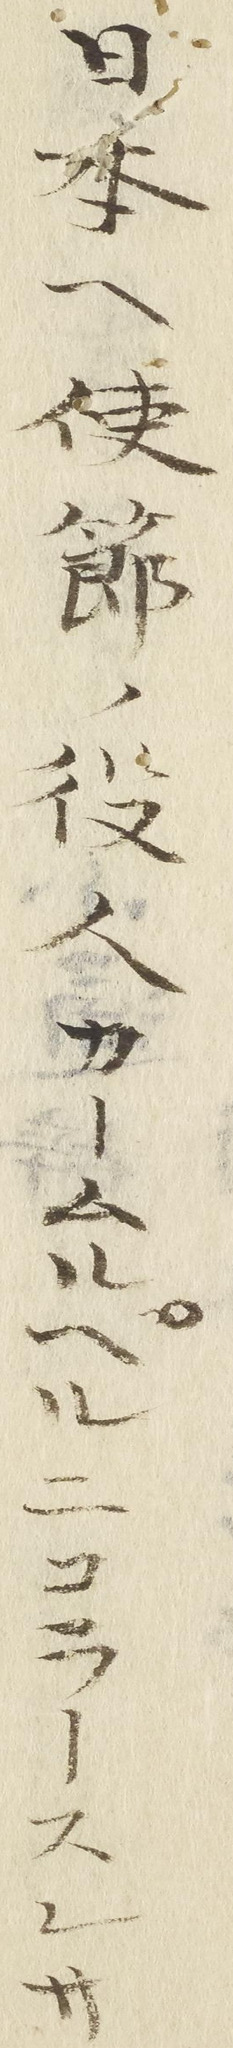日本ヘ使節ノ役人カームルペルニコラースレサ
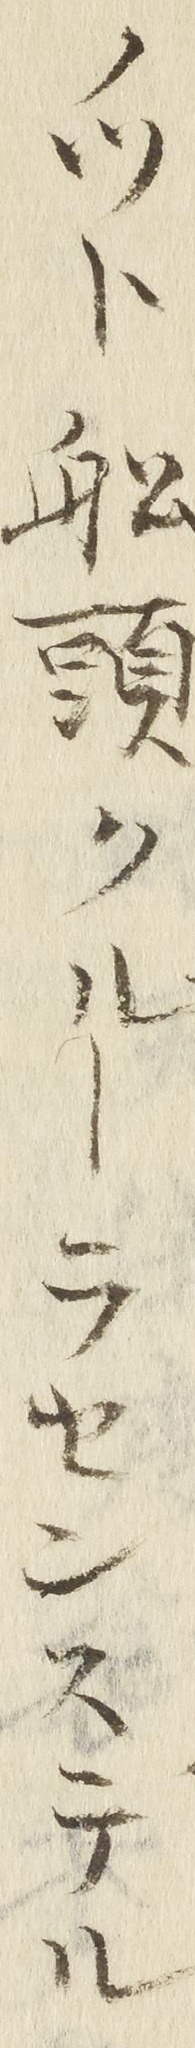ノツト船頭クルーランステル
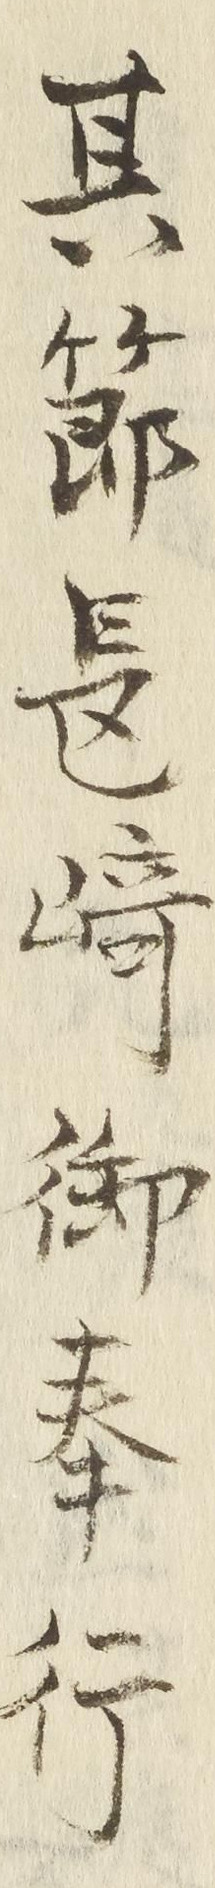其節長崎御奉行
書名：天象話説
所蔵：東京大学地震研究所図書室 Earthquake Research Institute Library, The University of Tokyo, JAPAN
